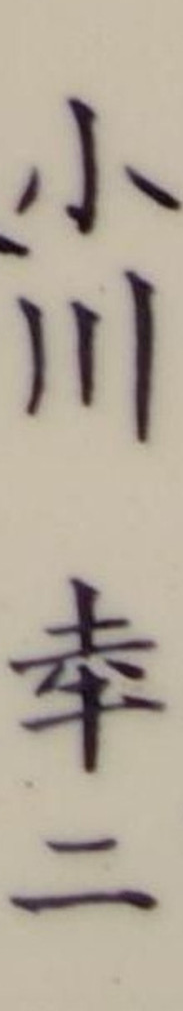小川幸二
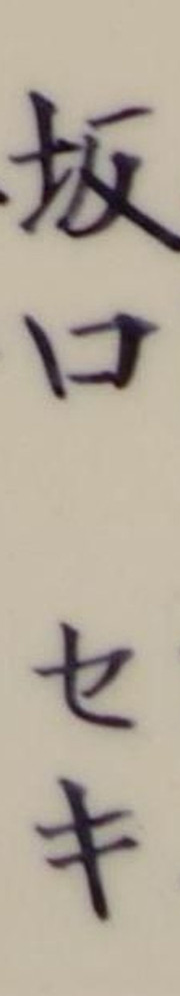坂口セキ
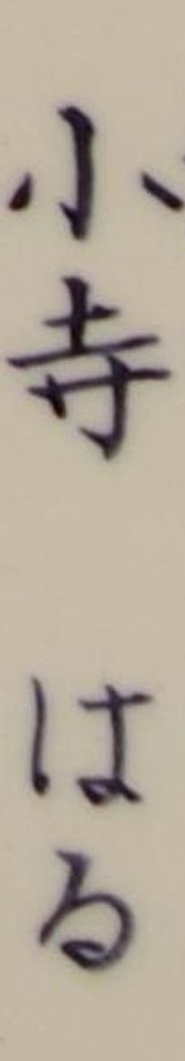小寺はる
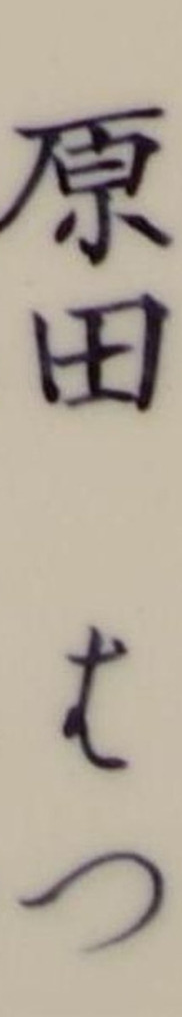原田はつ
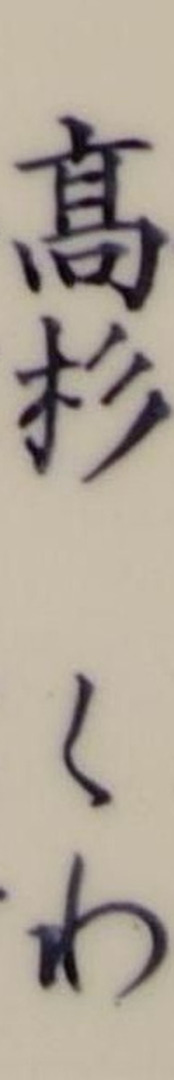高杉くわ
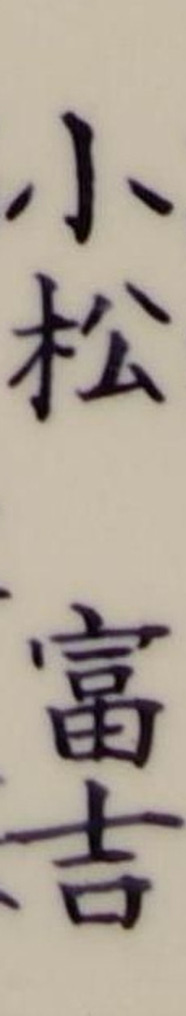小松富吉
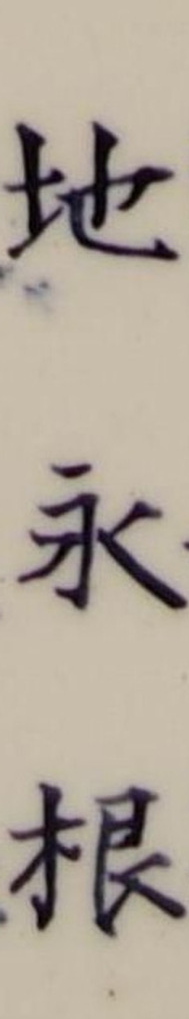地永根
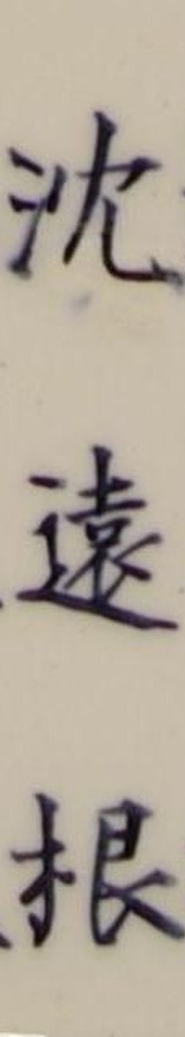沈遠根
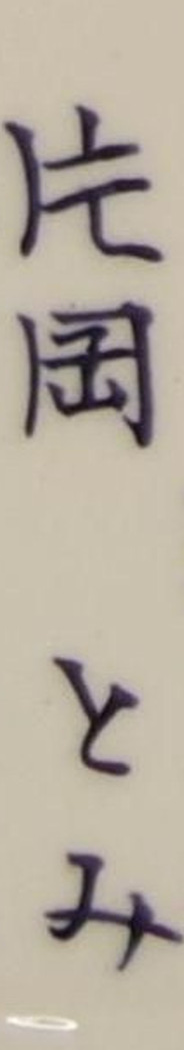片岡とみ
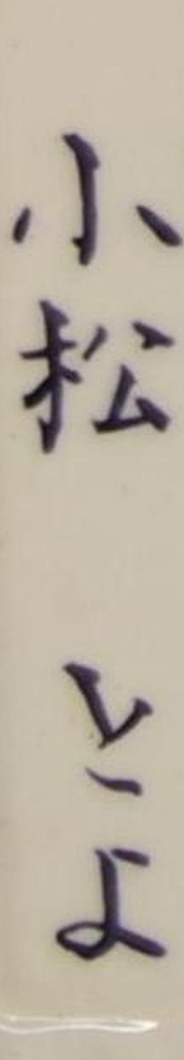小松とよ

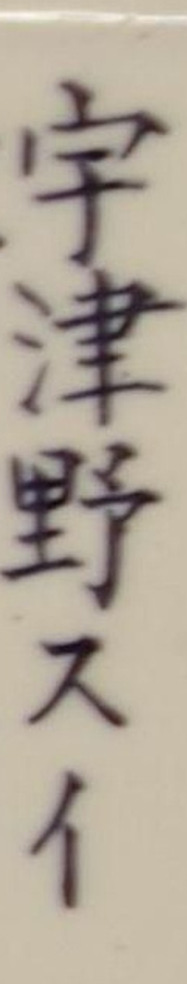宇津野スイ
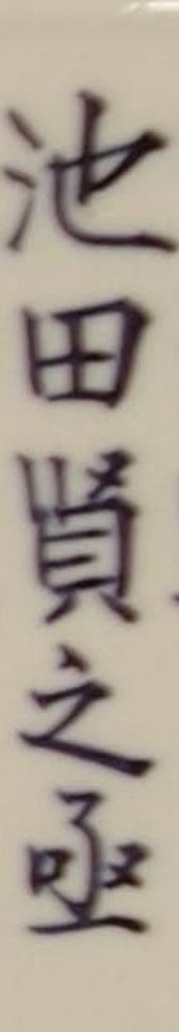池田賀之丞
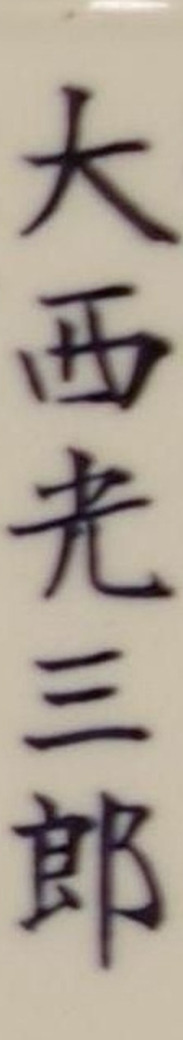大西光三郎
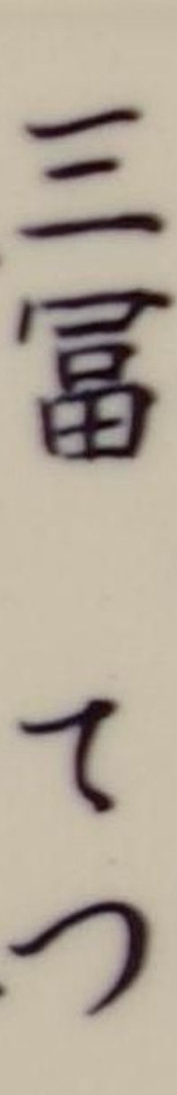三冨てつ
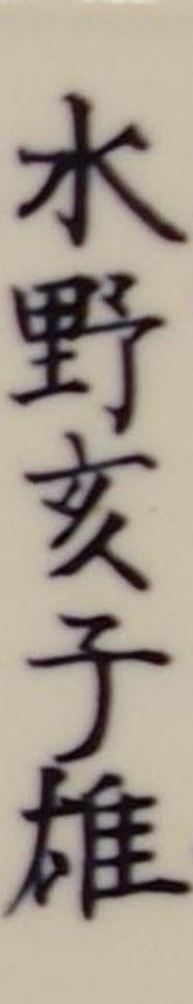水野亥子雄
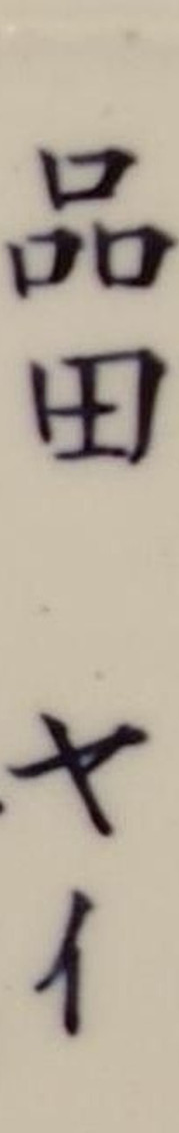品田ヤイ
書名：E~L
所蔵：高野山金剛峯寺
